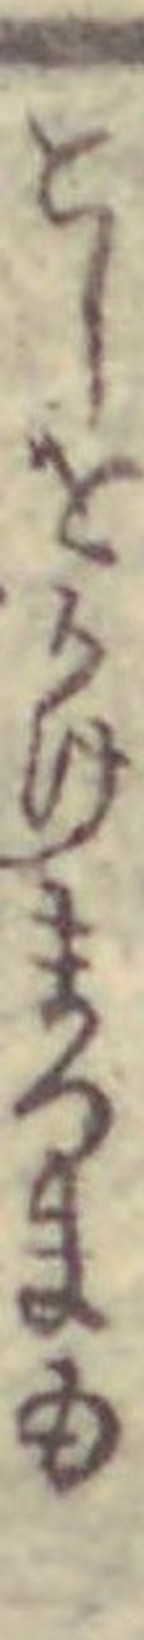こしをかけまつまも
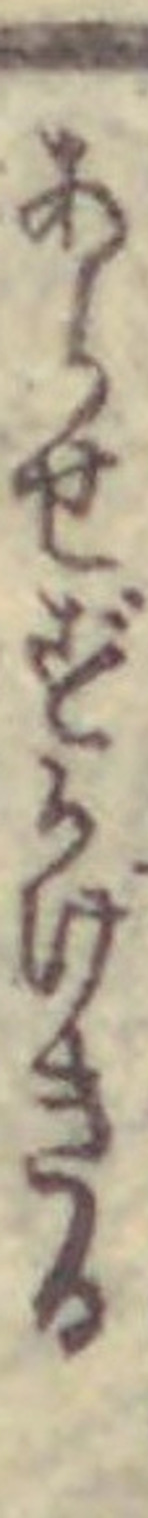あらせずかけきる
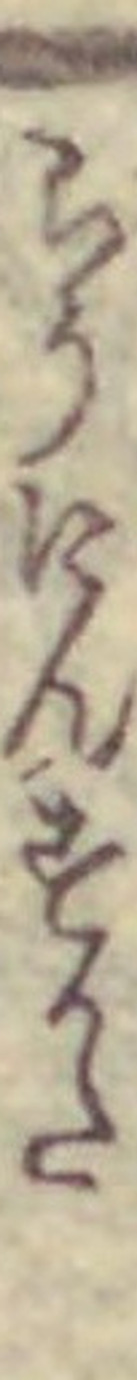らうにんすかた
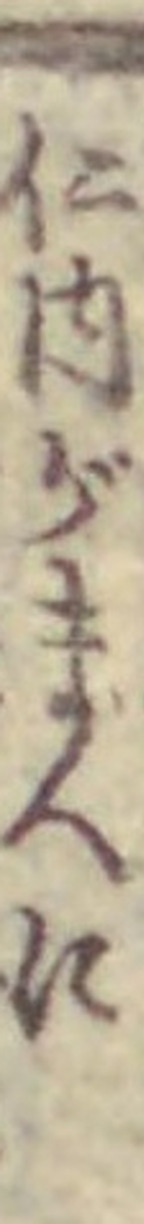仁内がまへに
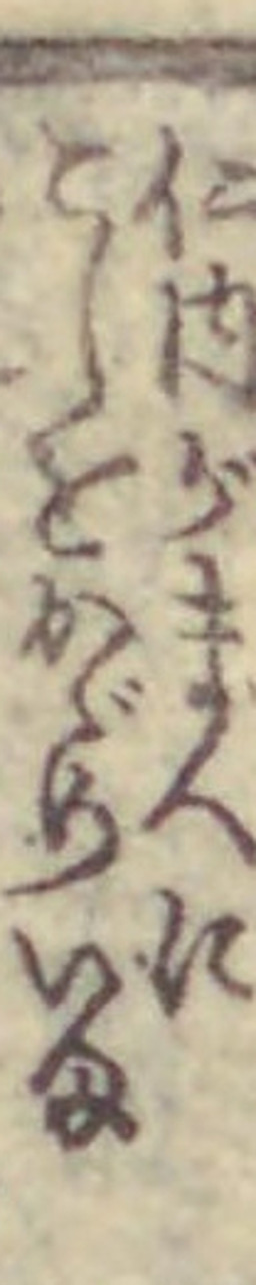こしをかゞめいま
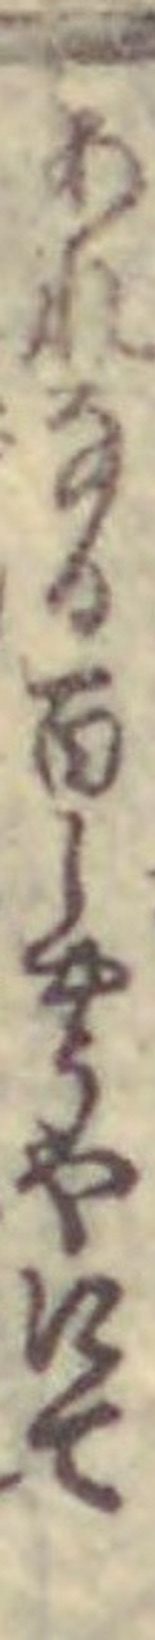あれなる百しやうやにて
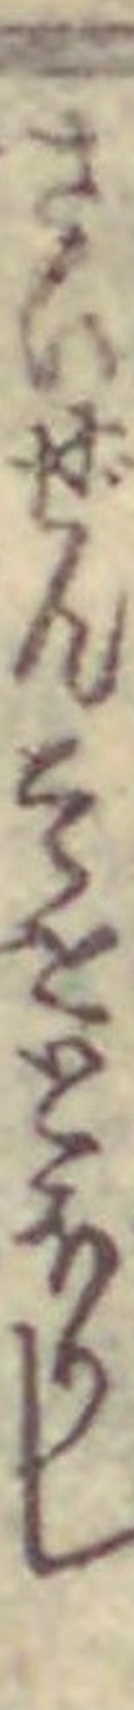さいぜんこゝをとほりし
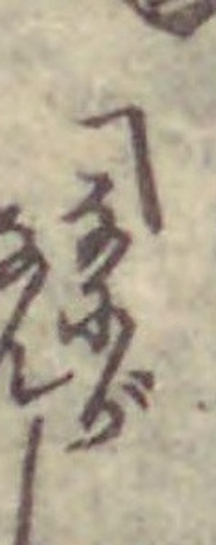〽なにが
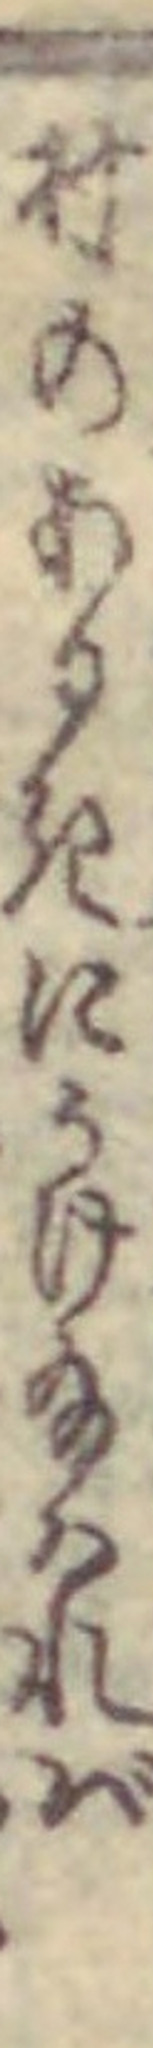村のあるきにうけ給はれば
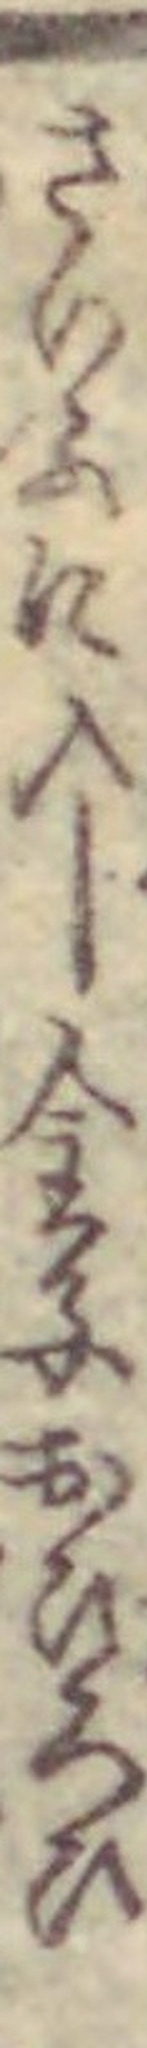さいふに入し金子おひろひ
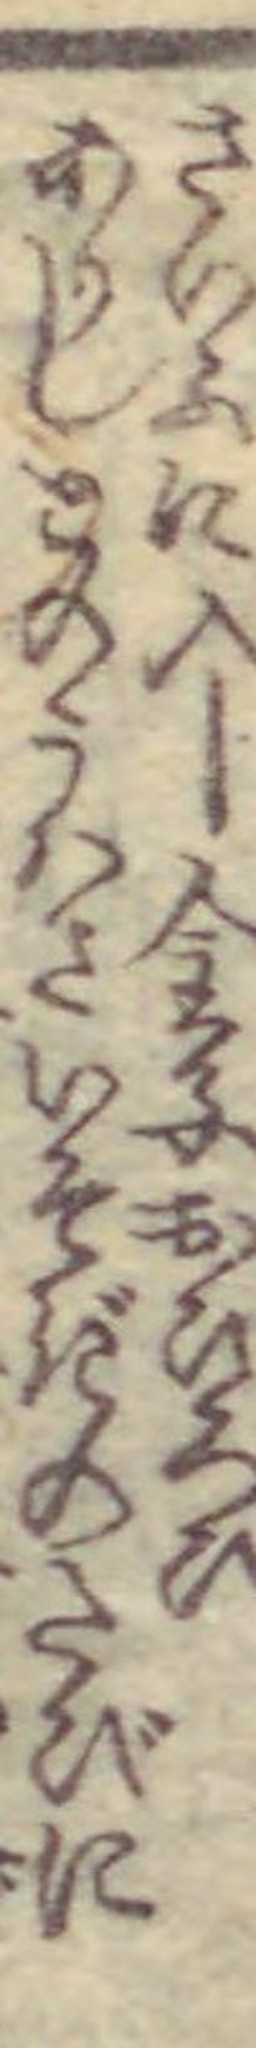ありしとのうはさいそぎのたびに
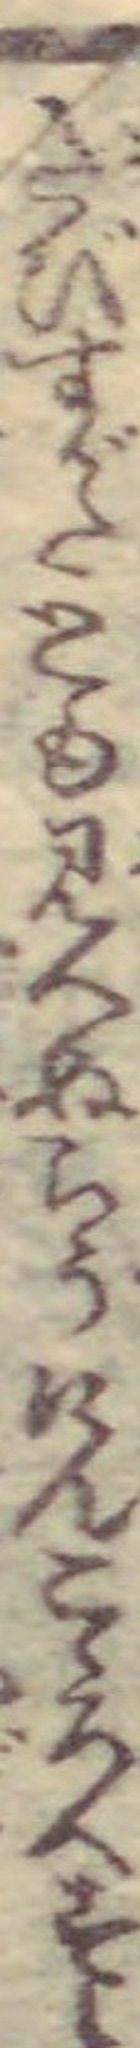たびすがたとも見へぬらうにんこゝろへずと
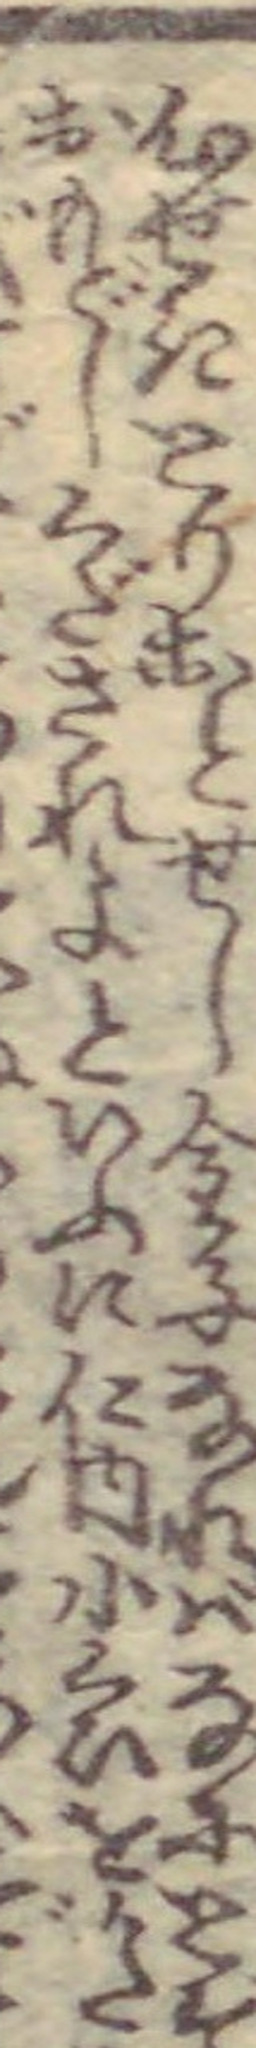おもどしくだされよといふに仁内小くひをかたむけ
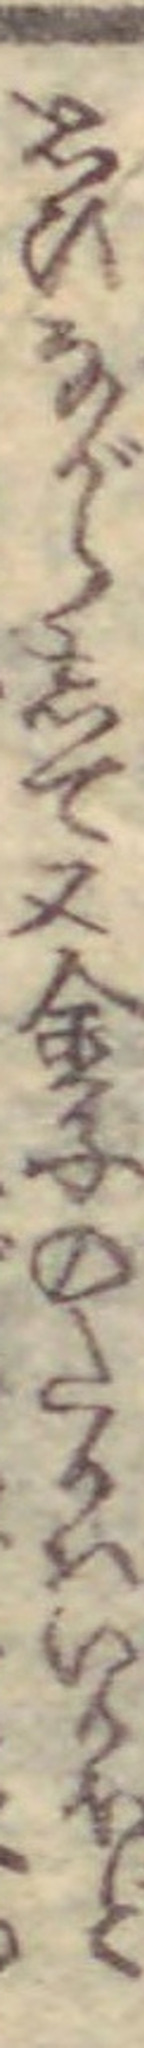思ひながらして又金子のたかはいかほど
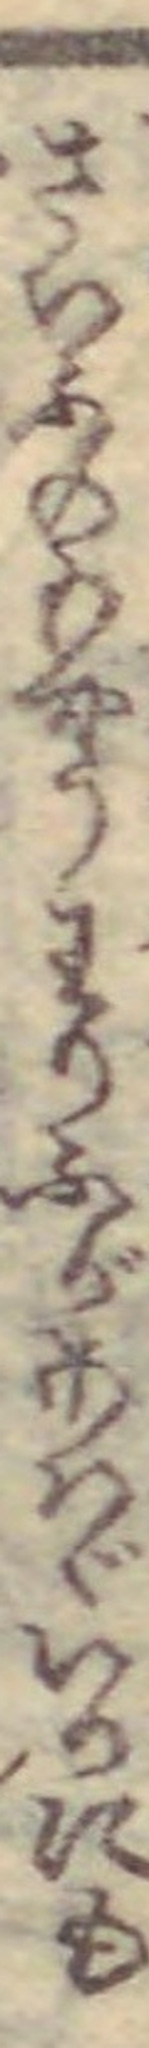さいふのもやうわりふがあはゞいかにも
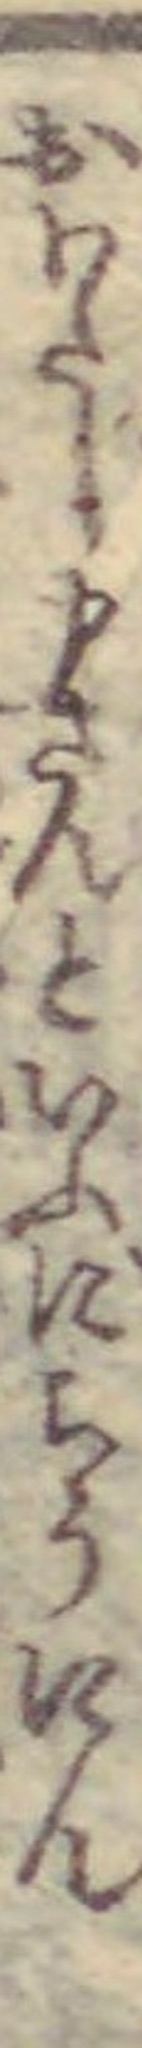おわたし申さんといふにらうにん
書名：八ツ目鱣因縁物語 3巻
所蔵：国立国会図書館 National Diet Library, JAPAN
